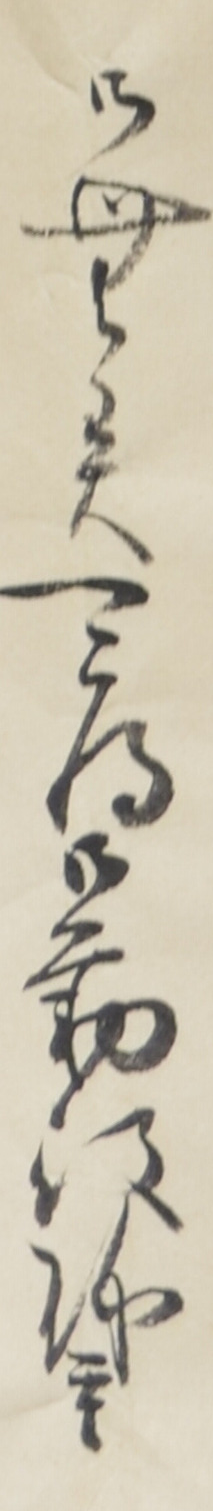御無候可為御勤役珍重
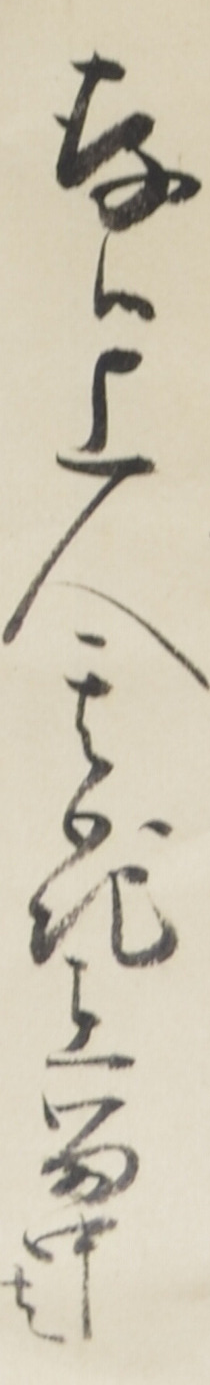存候上人其御地在留中は
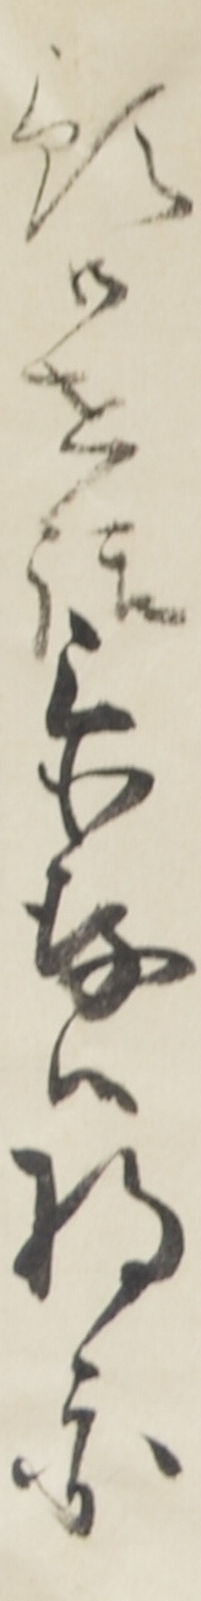預御世話忝存候将亦
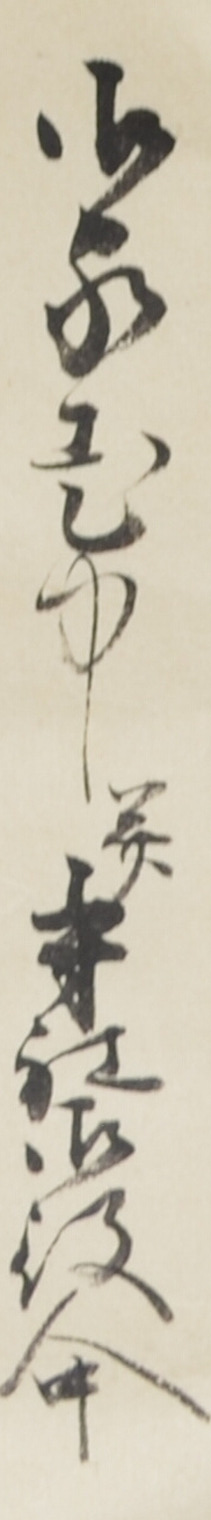御家老中并寺社御役人中
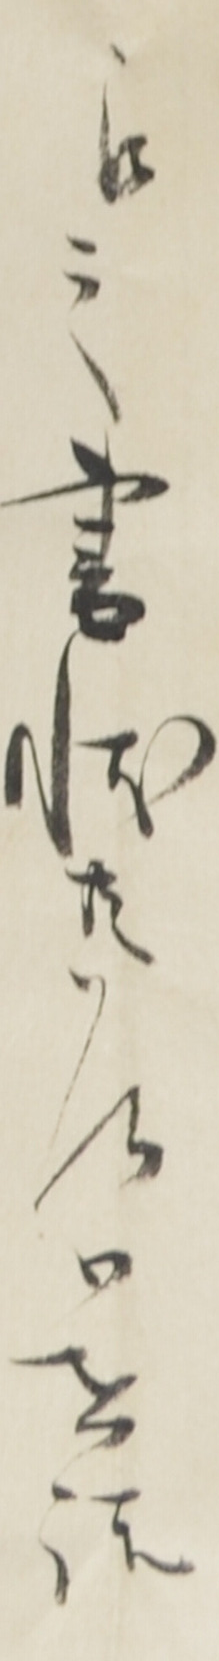江之書状共乍御世話
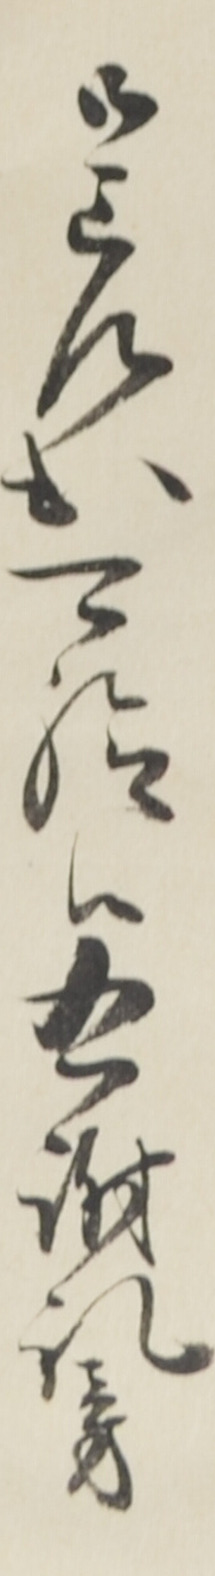御差出可給候右謝礼旁
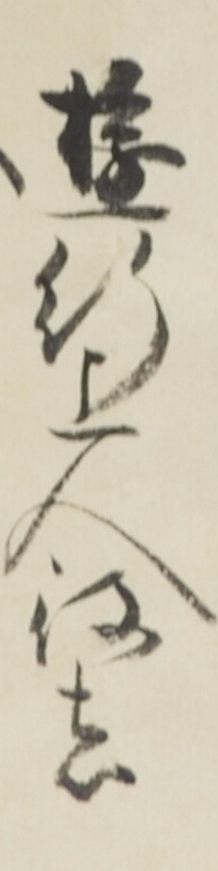遊行上人役者
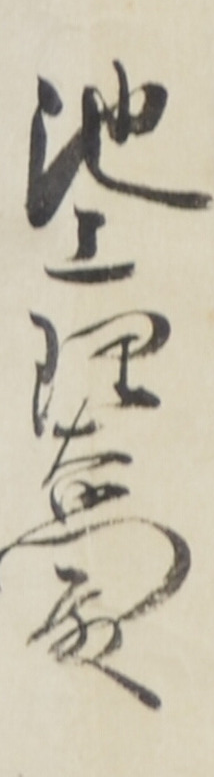池上理右衛門殿
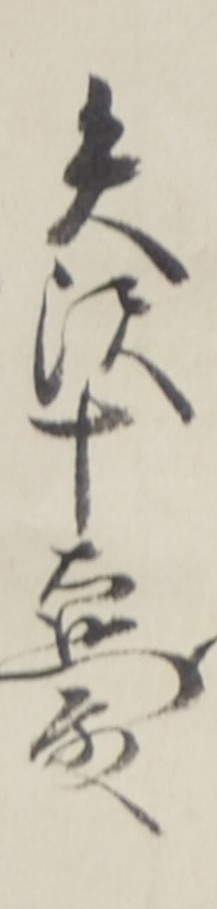矢沢十右衛門殿
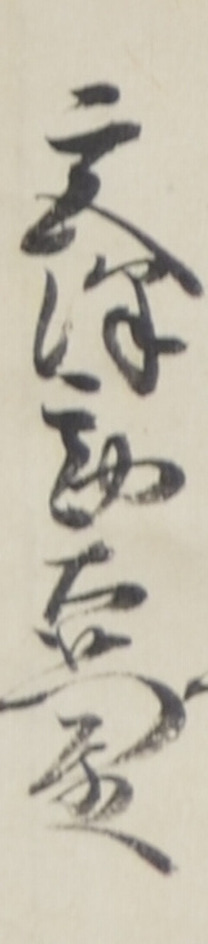宮澤勘右衛門殿
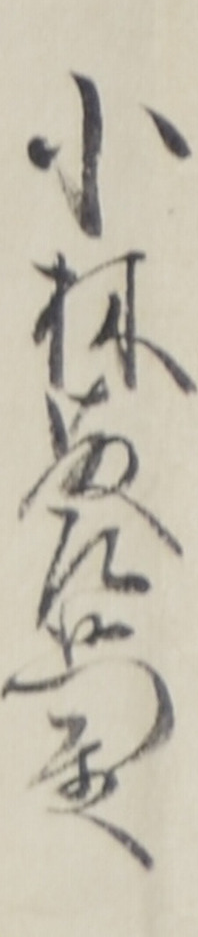小林藤左衛門殿
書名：（書状）
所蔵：伊那市立高遠町図書館・合同会社AMANE
